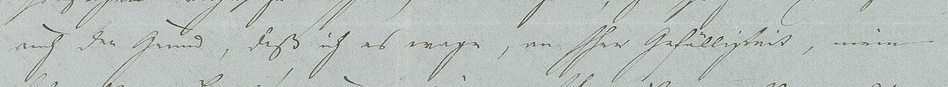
auch der Grund, daß ich es wage, an Ihre Gefälligkeit, mein
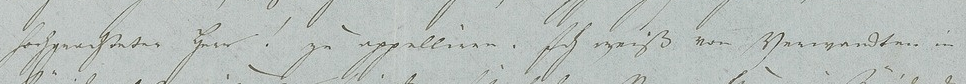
hochgeachteter Herr! zu appelliren. Ich weiß von Verwandten in
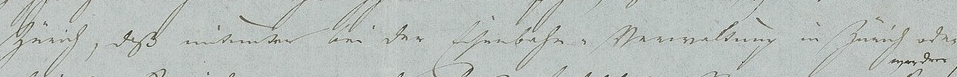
Zürich, daß mitunter bei der Eisenbahn-Verwaltung in Zürich oder
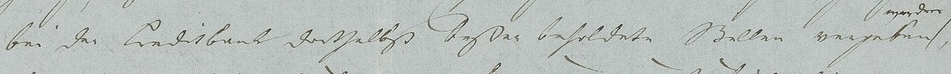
bei der Creditbank dortselbst besser besoldete Stellen vergeben
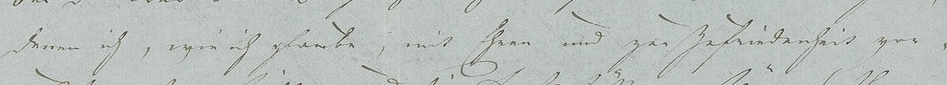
denen ich, wie ich glaube, mit Ehren und zur Zufriedenheit vor-
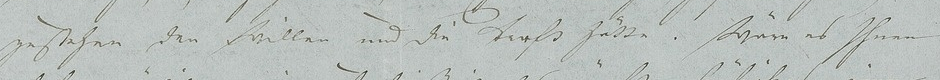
zustehen den Willen und die Kraft hätte. Wäre es Ihnen
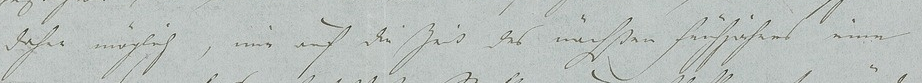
daher möglich, mir auf die Zeit des nächsten Frühjahres eine
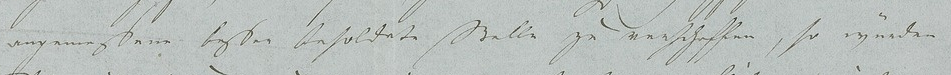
angemessene besser besoldete Stelle zu verschaffen, so würden
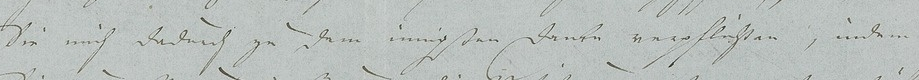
Sie mich dadurch zu dem innigsten Danke verpflichten, indem
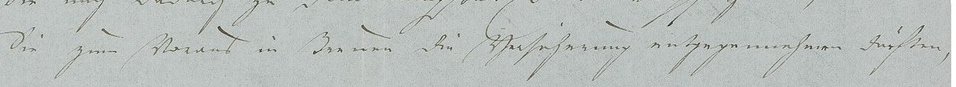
Sie zum Voraus in Treuen die Versicherung entgegennehmen dürften,
